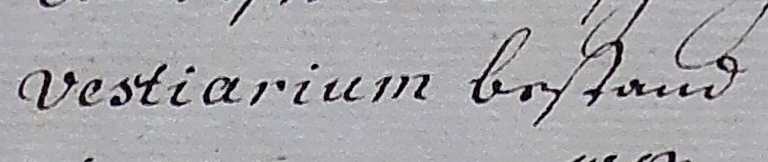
vestiarium bestand
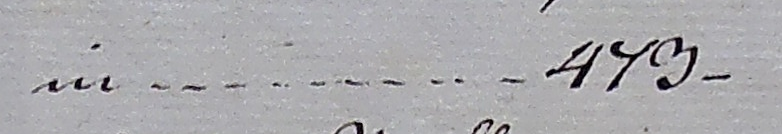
in _ _ _ _ _ _ _ . . _ 473-
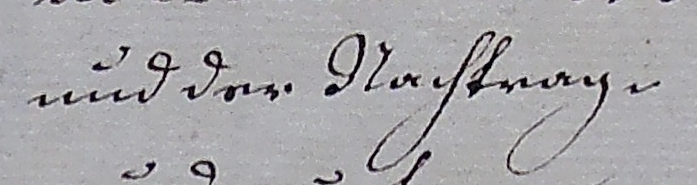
und der Nachtrage
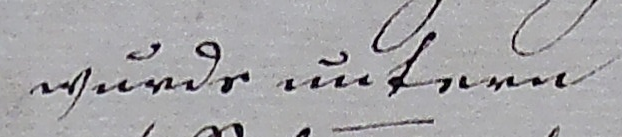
wurde untern
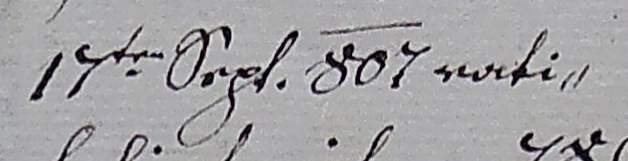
17te͇n Sept. 8͞0͞7 rati¬
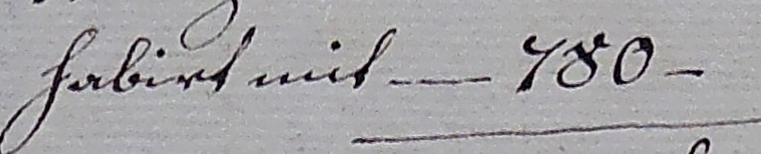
habirt mit ___ 780 -
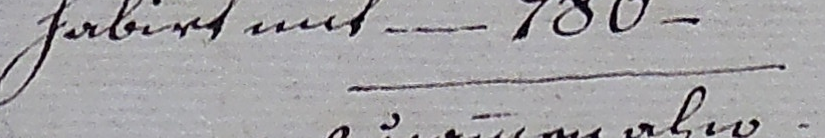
-------------------
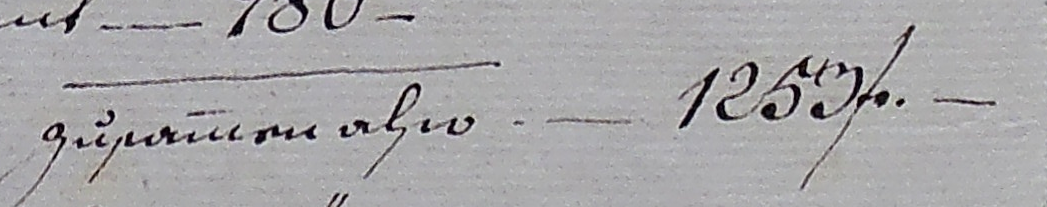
zusam̅en also . _______1253fr. ---
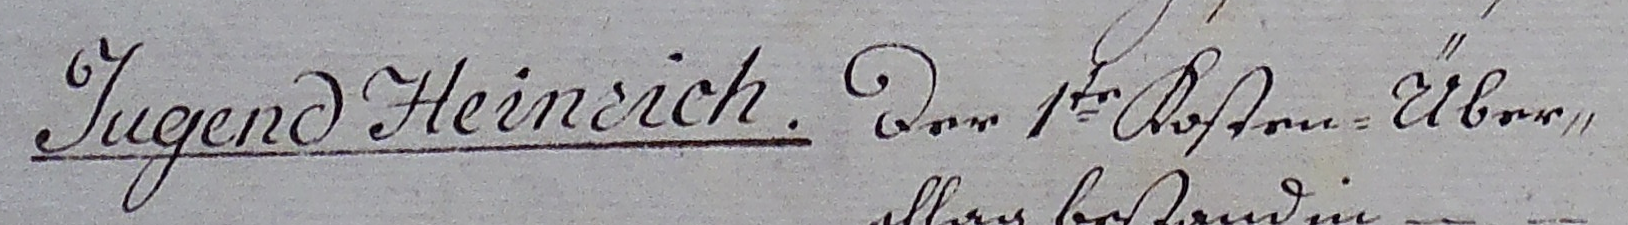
Jugend Heinrich. Der 1te͇ Kosten = Über¬
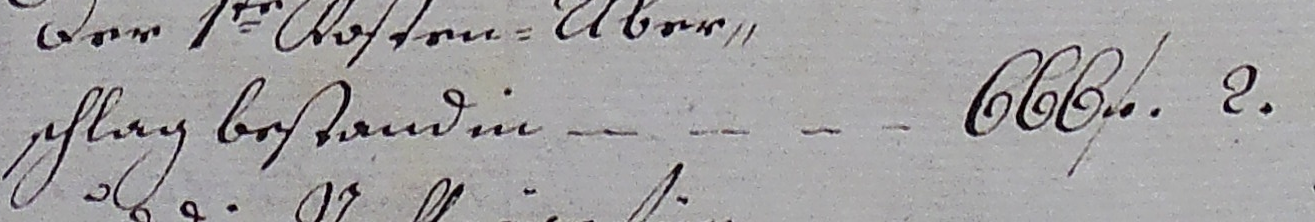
schlag bestand in . _ _ _ _ 666fr. 2.
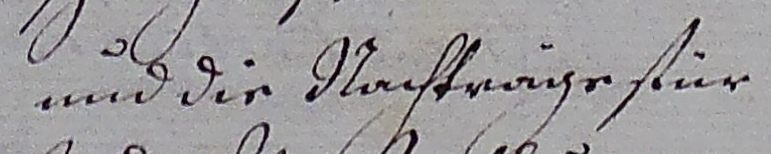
und die Nachträge für
